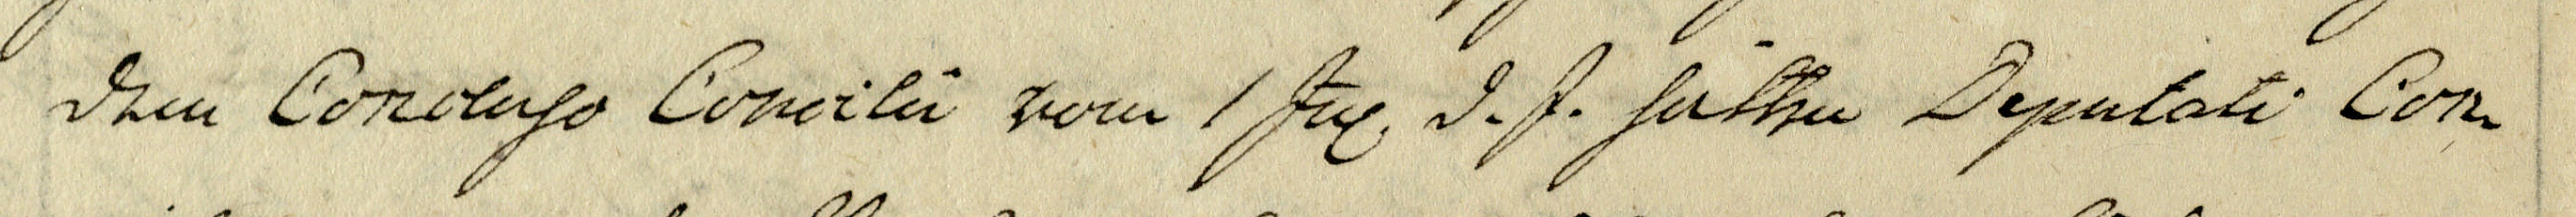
dem Concluso Concilii vom 1 Jul. d. J. hätten Deputati Con¬
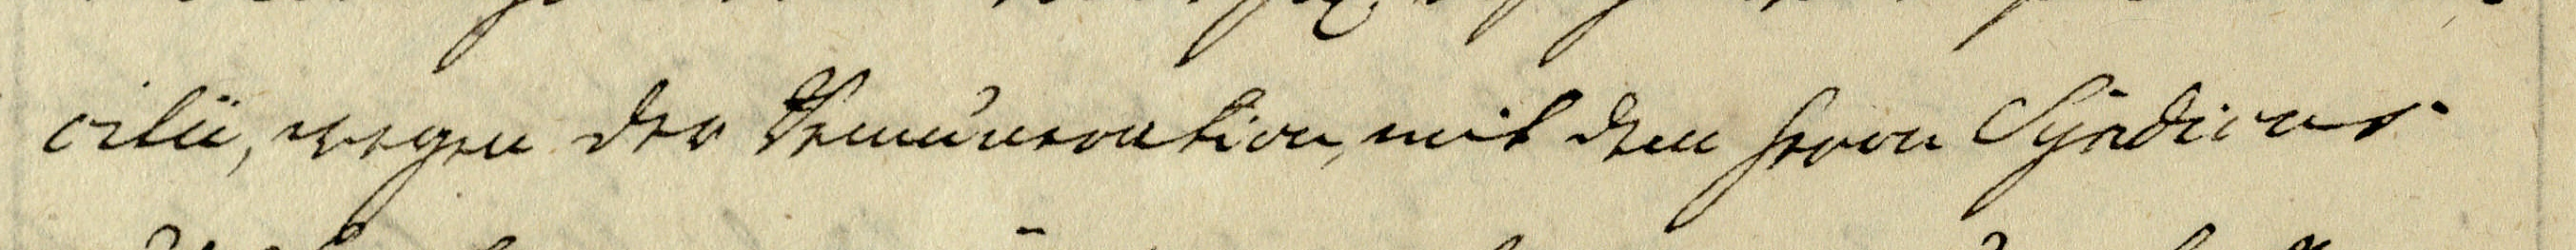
cilii, wegen der Remuneration mit dem Herrn Sÿndicus
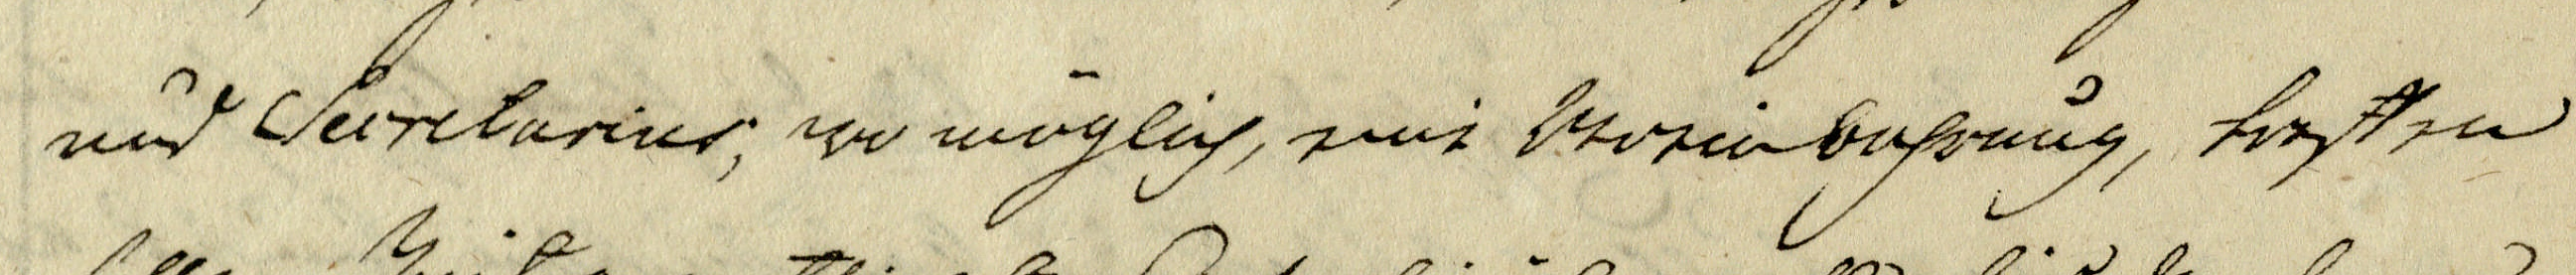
und Secretarius, wo möglich, eine Vereinbahrung, treffen
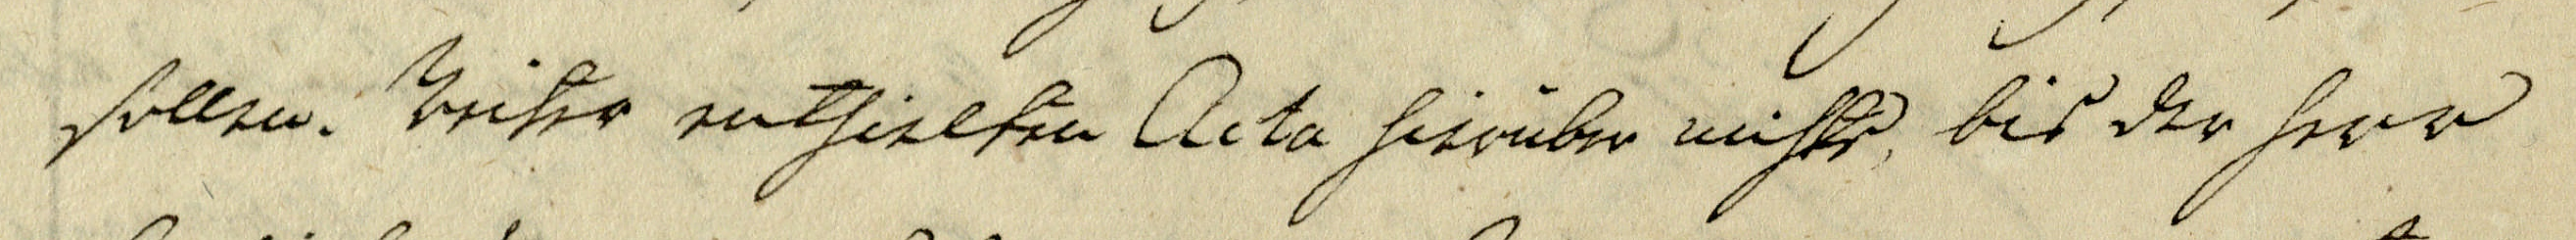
sollen. Weiter enthielten Acta hierüber nichts, bis der Herr
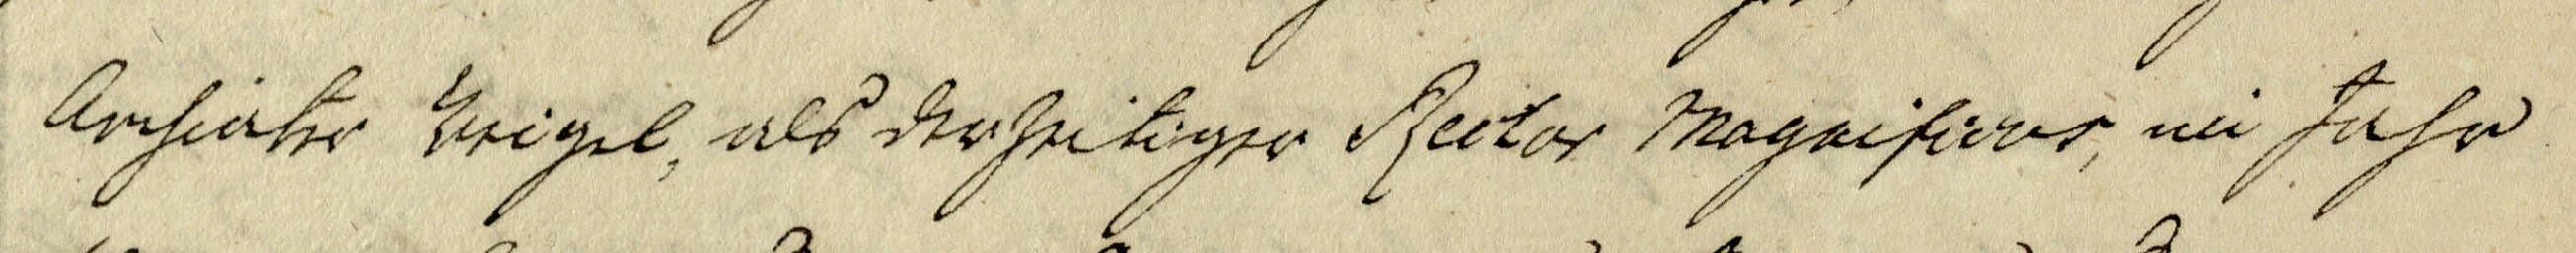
Archiater Weigel, als derzeitiger Rector Magnificus, im Jahr
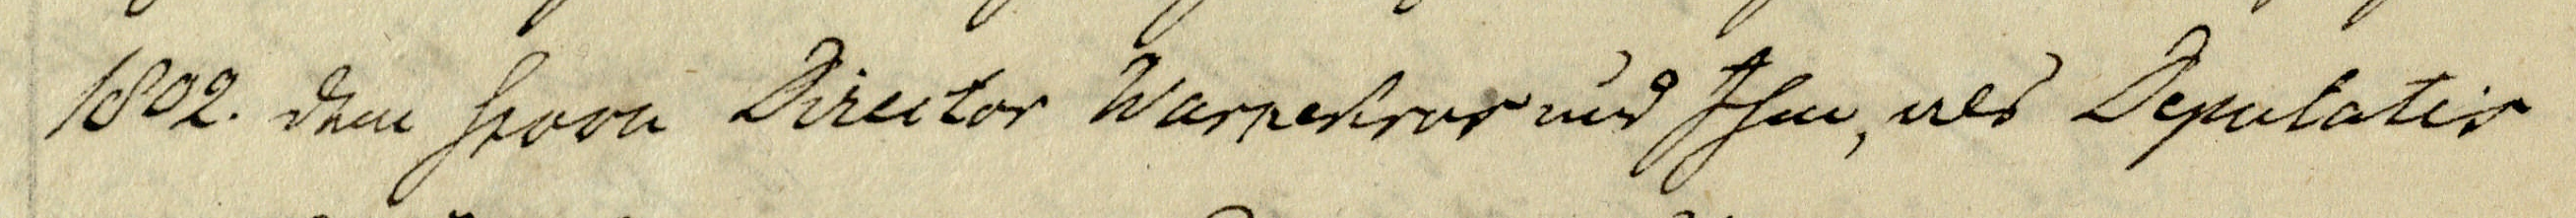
1802. dem Herrn Director Warnekros und Ihm, als Deputatis
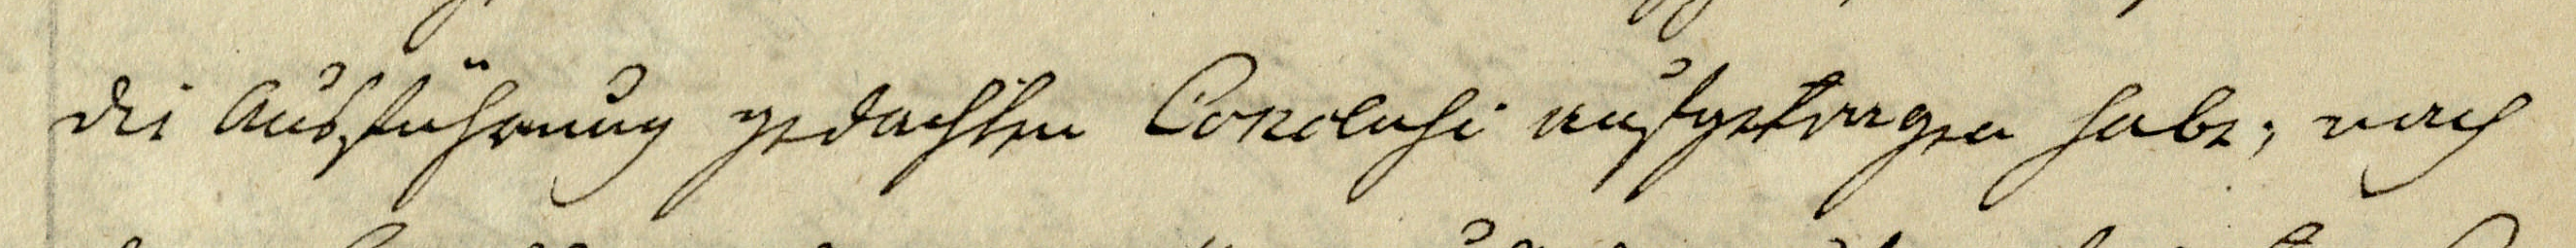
die Ausführung gedachter Conclusi aufgetragen habe, nach
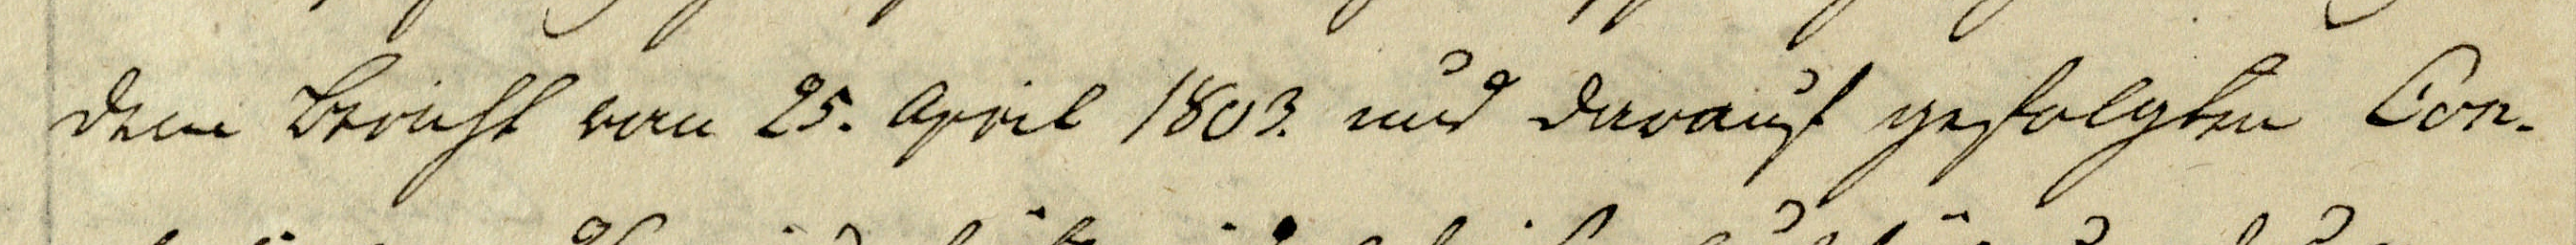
dem Bericht vom 25. April 1803. und darauf gefolgten Con¬
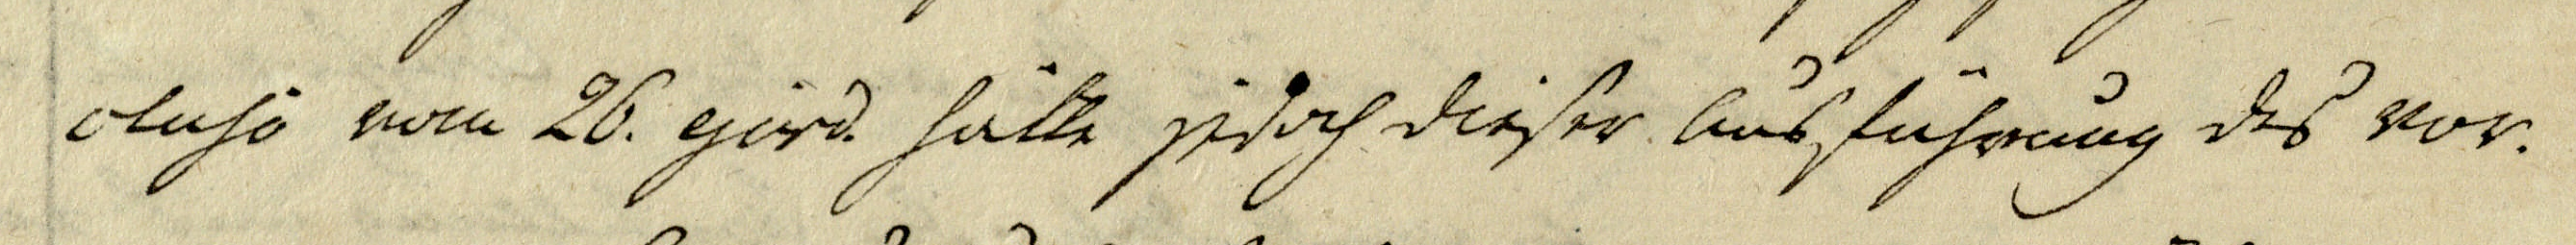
cluso vom 26. ejusd. hätte jedoch dieser Ausführung des vor¬
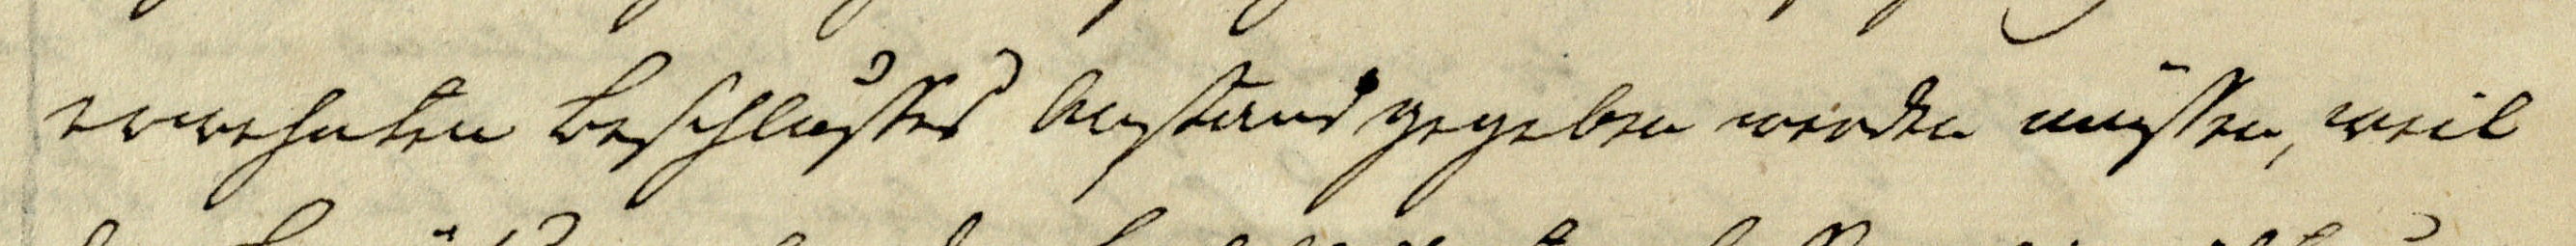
erwehnten Beschlusses Anstand gegeben werden müssen, weil
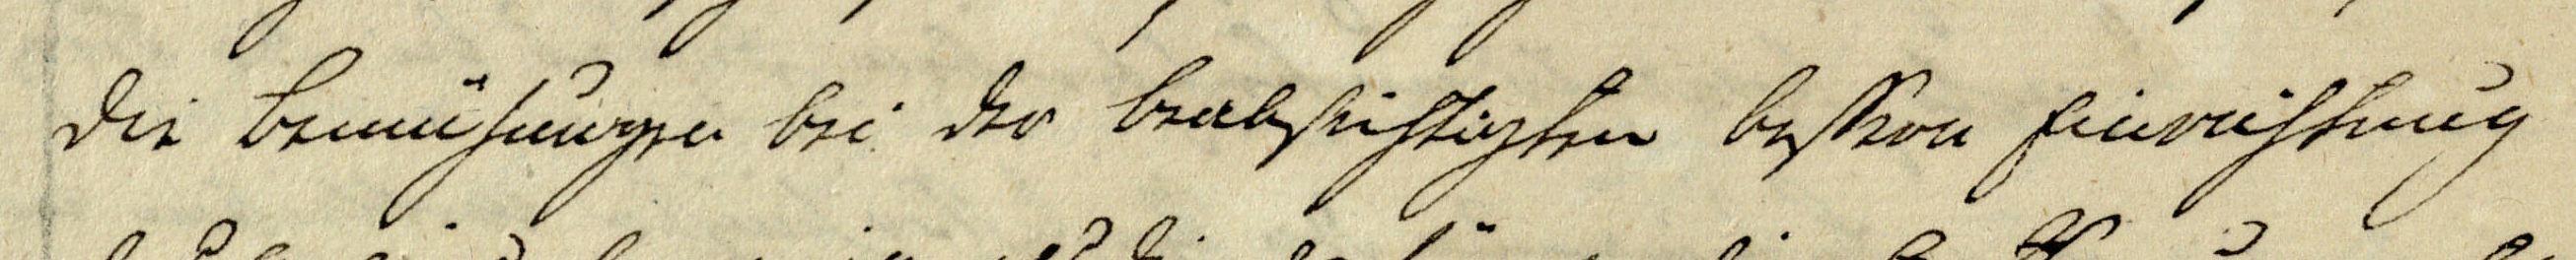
die Bemühungen bei der beabsichtigten bessern Einrichtung
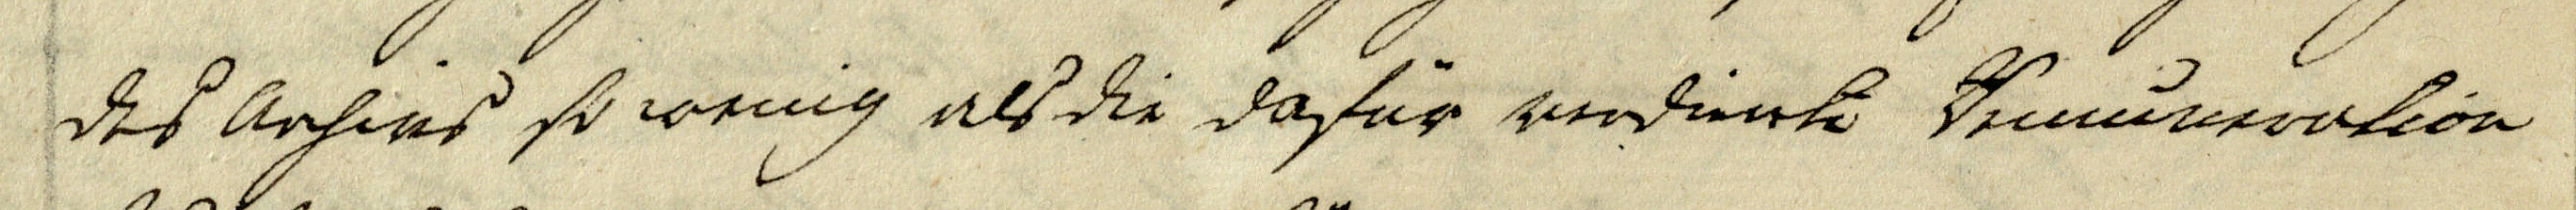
des Archivs so wenig als die dafür verdiente Remuneration
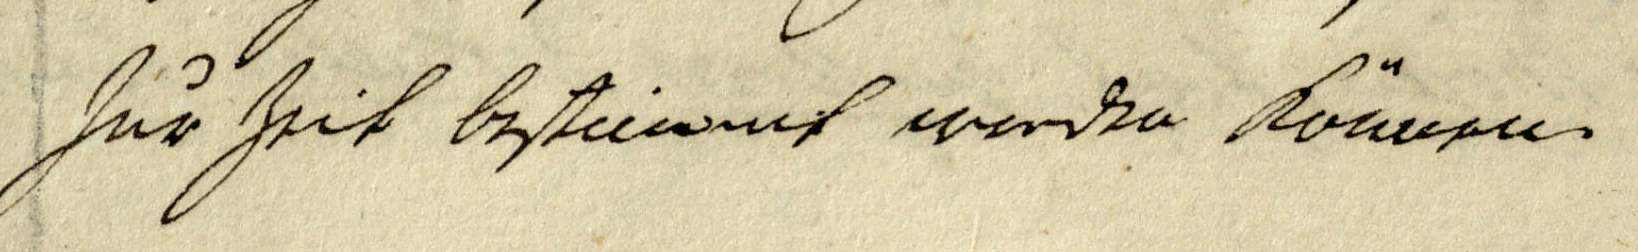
zur Zeit bestimmt werden können.
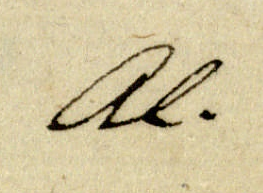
Al.
